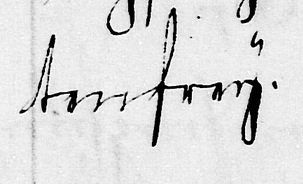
ten frey.
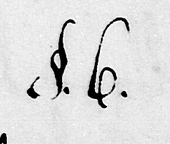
§. 6.
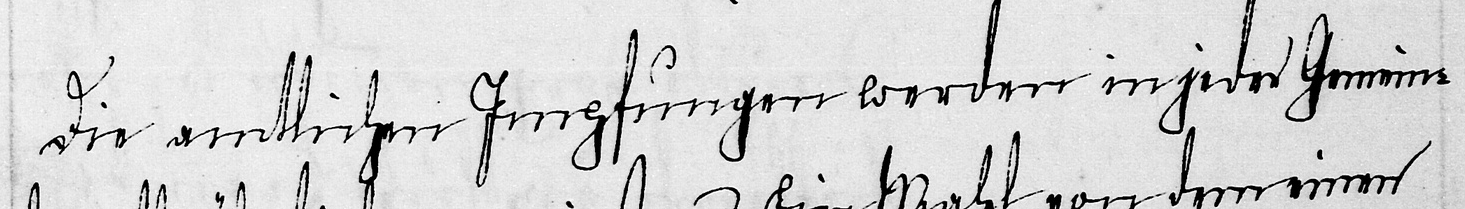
Die amtlichen Impfungen werden in jeder Gemein¬
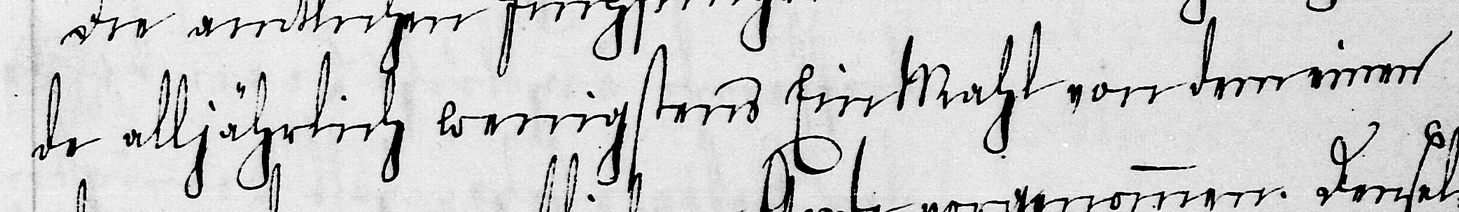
de alljährlich wenigstens Ein Mahl von dem einen
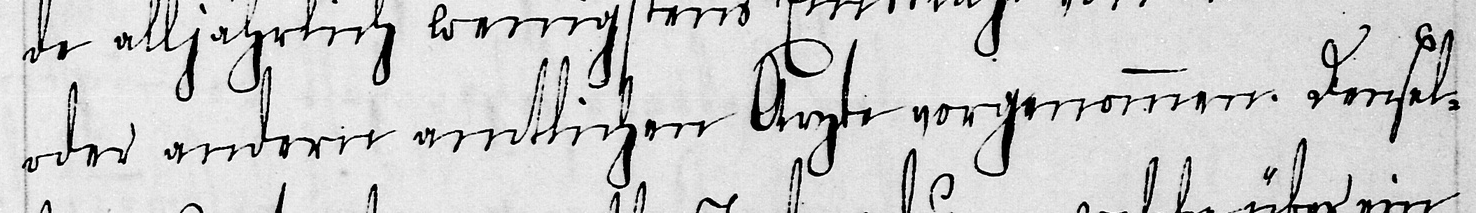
oder andern amtlichen Arzte vorgenommen. Densel¬
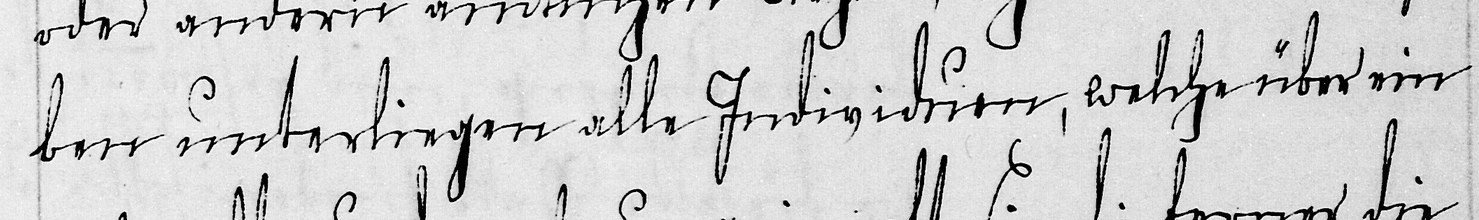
ben unterliegen alle Individuen, welche über ein
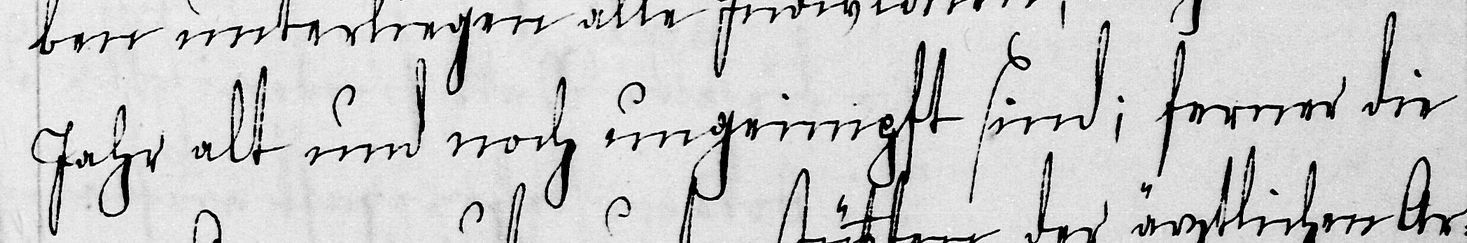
Jahr alt und noch ungeimpft sind; ferner die
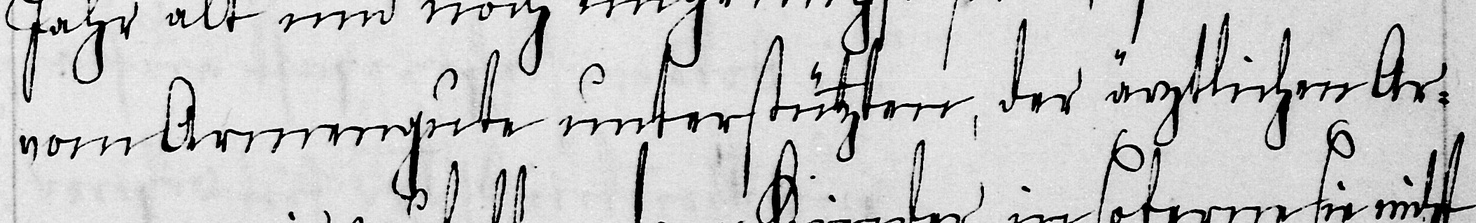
vom Armengute unterstützten, der ärztlichen Ar¬
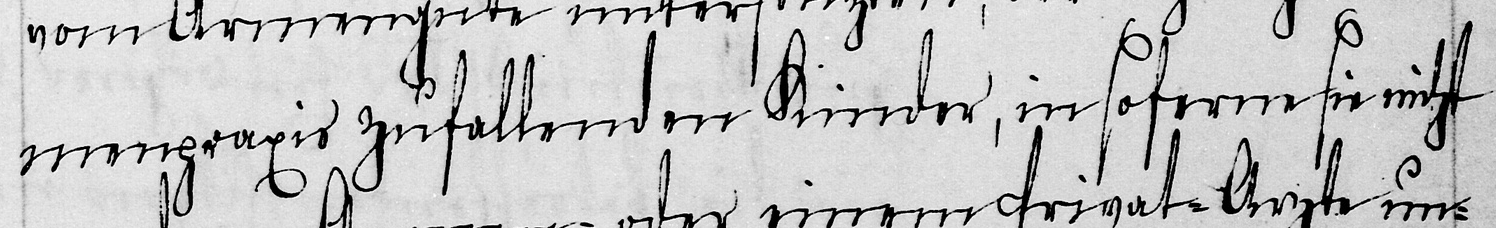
menpraxis zufallenden Kinder, insoferne sie nicht
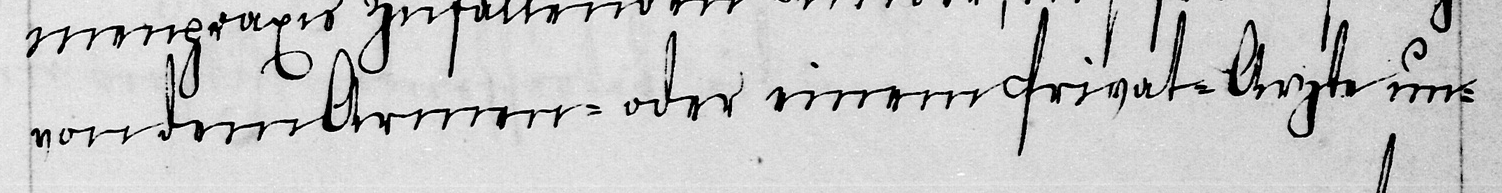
von dem Armen- oder einem Privat-Arzte un-
